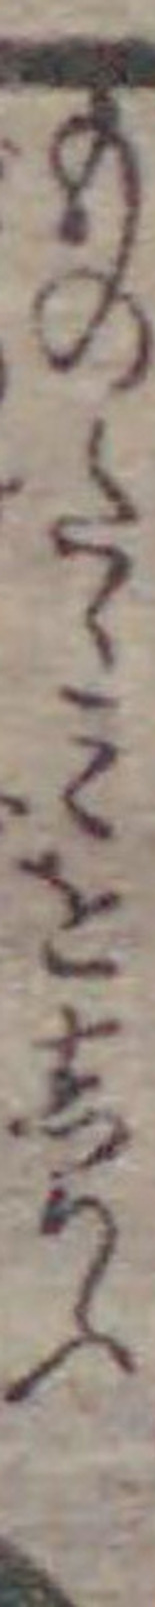ものたゝみをしかへ
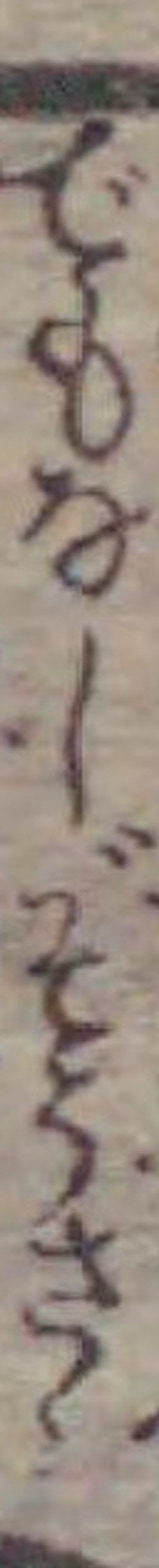でもなしぞうさく
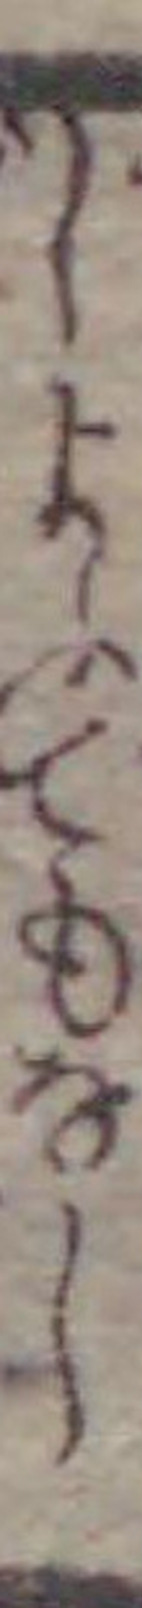しよふでもなし
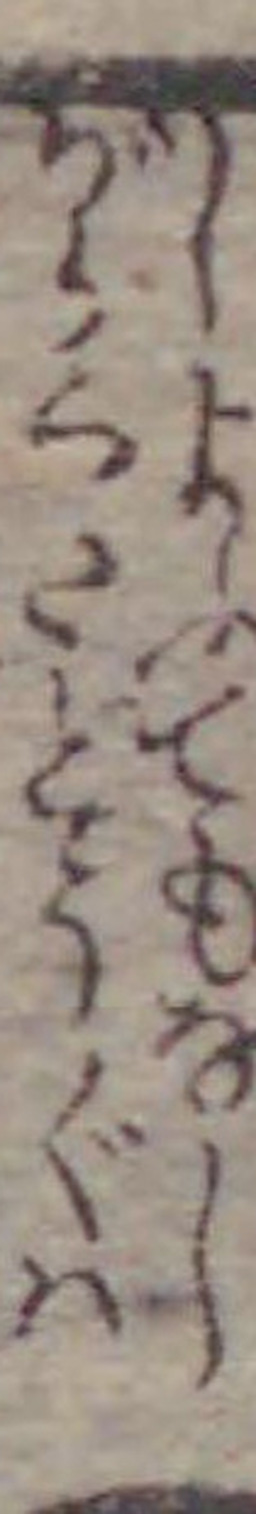がらくたとうぐは
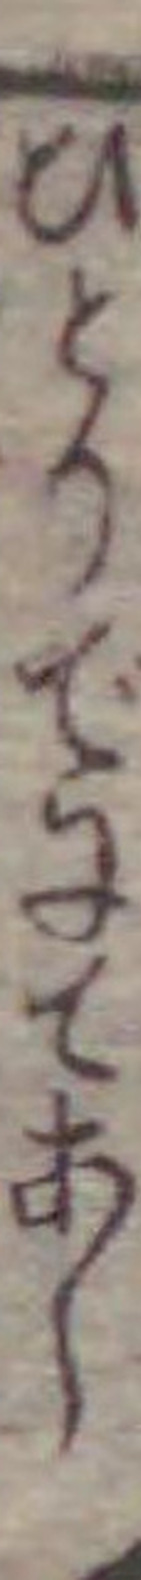ひとりでにてあし
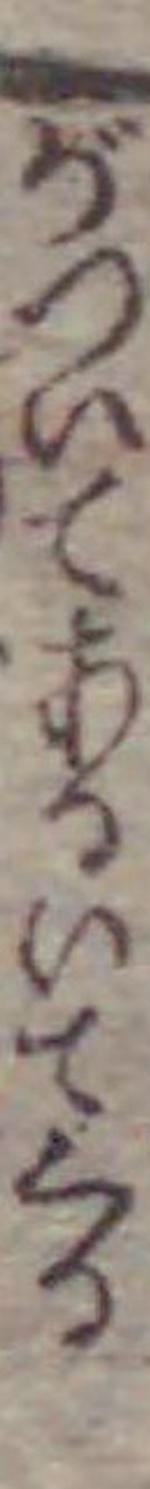がついてあるいてくる
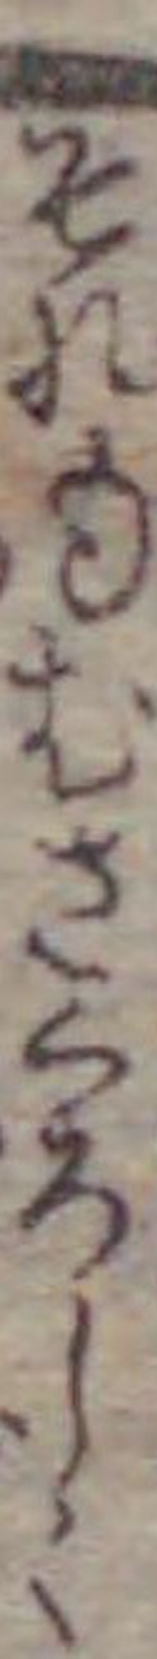それもむさくろしく
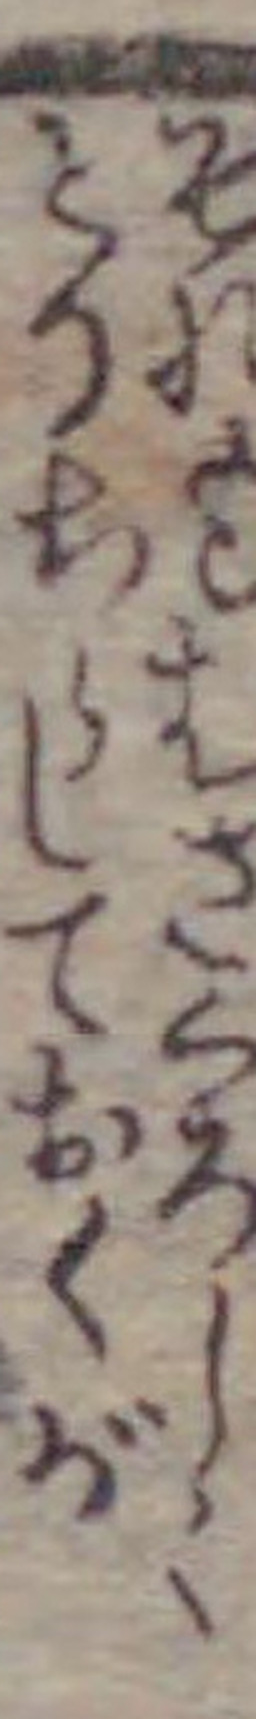とりちらしておくが
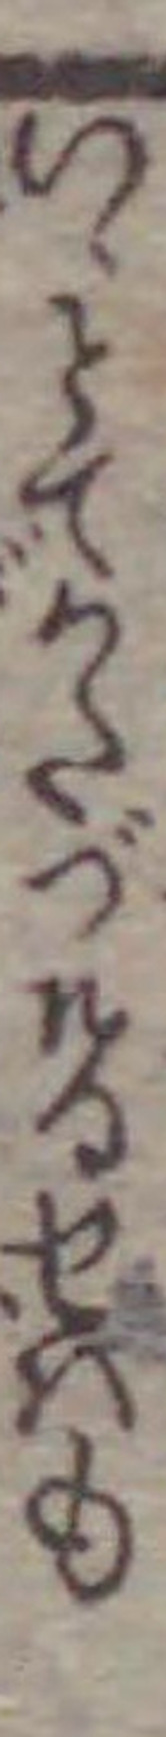いゝとてかたづけるせはも
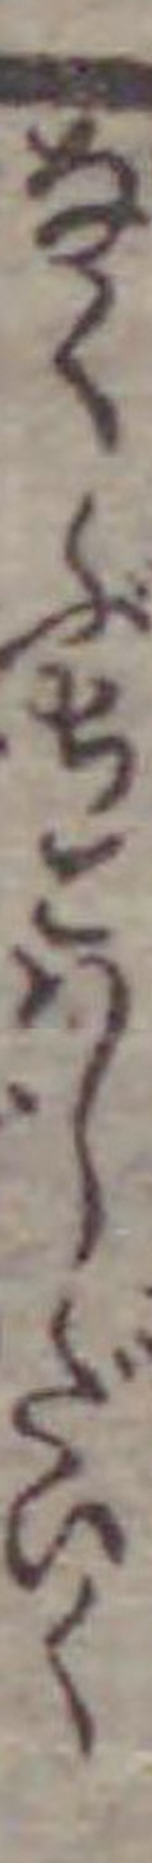なくぶちこはしだいく
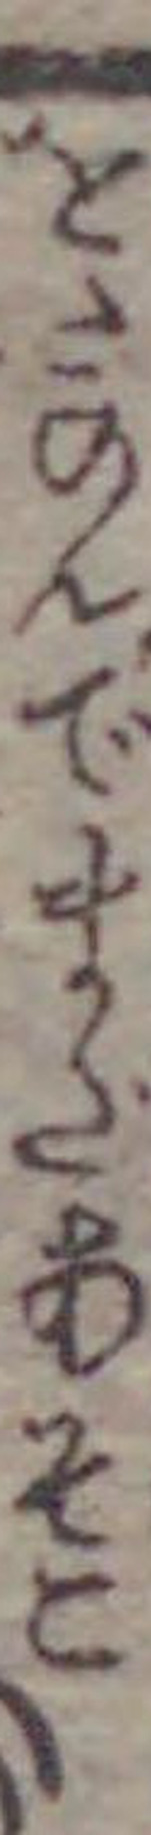をたのんでまだあそこ
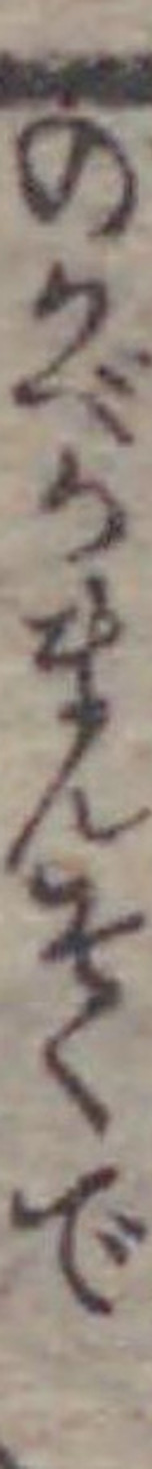のかべかまんそくで
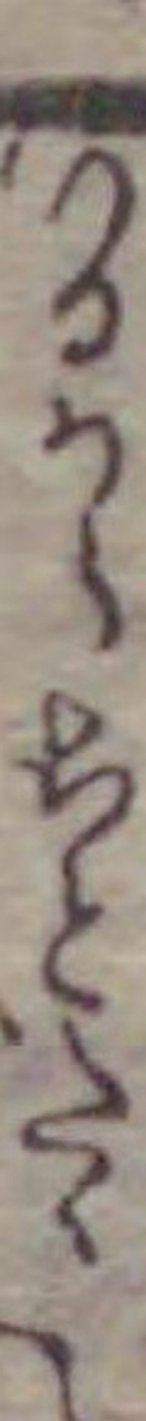あるからちとたゝ
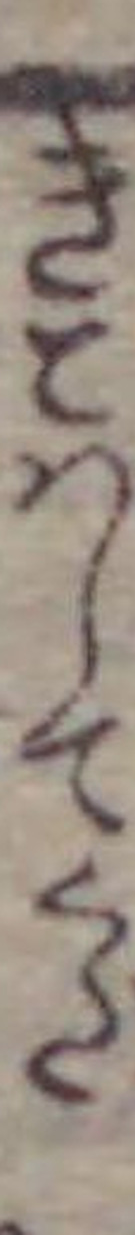きこはしてくだ
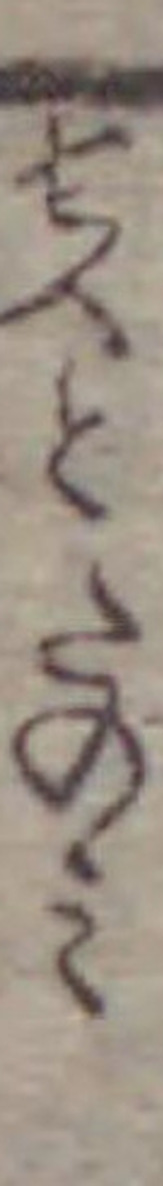せへとたのみ
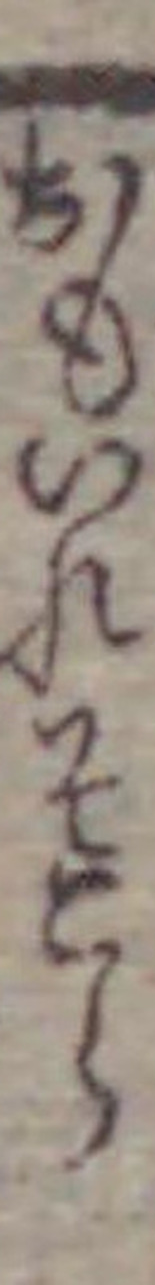おもいれそこら
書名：化物見世開 : 2巻
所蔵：国立国会図書館 National Diet Library, JAPAN
